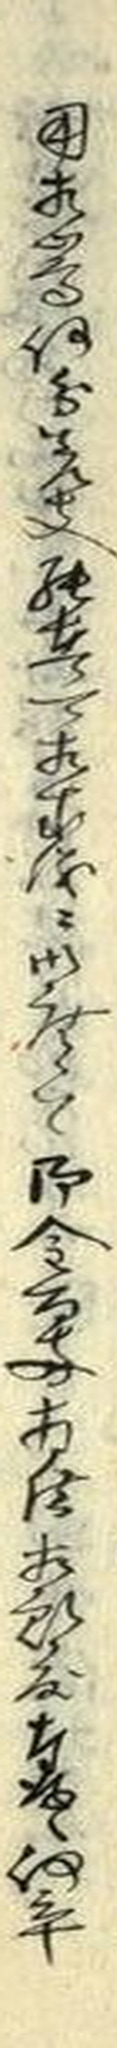用相嵩何分差支罷在候可相成儀ニ御座候ハヽ御金百両拝借相願度奉存候何卒
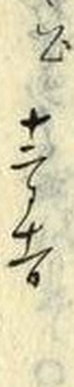一十二月十五日
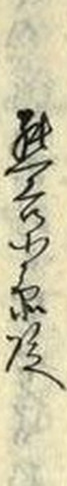熊谷小兵衛殿
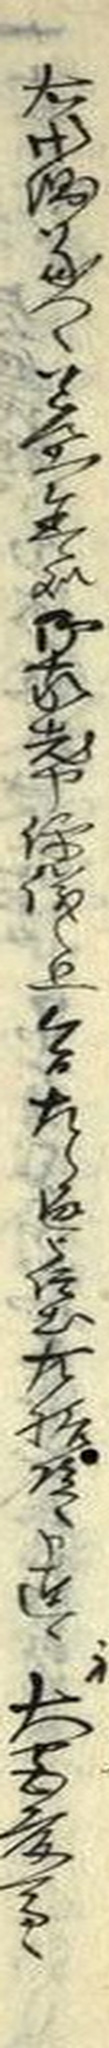右御側御用人へ差出置候処御家老中評議之上今日左之通被仰出左膳殿へ申達候
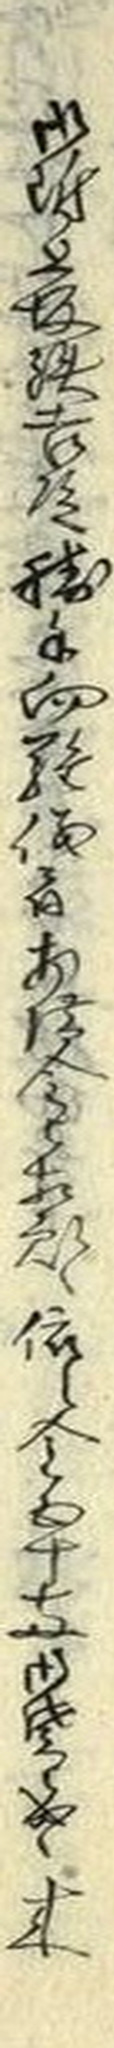御附上坂鉄吉殿勝手向難儀ニ付拝借金被相願候依之金五十両御貸被成候来
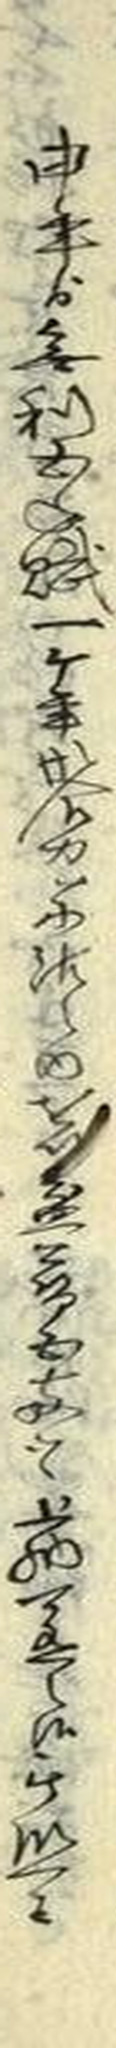申年ゟ無利五年賦一ケ年御合力米銀之内を以盆暮五両ツヽ上納可有之候其段可被
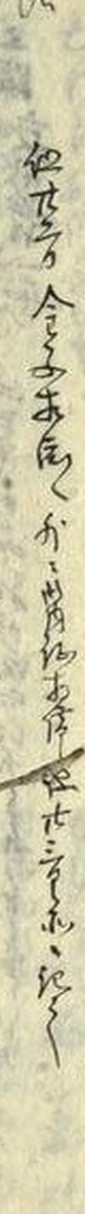取計候但其方金子相渡候外ニ御内証拝借之儀廿三日之所ニ記之
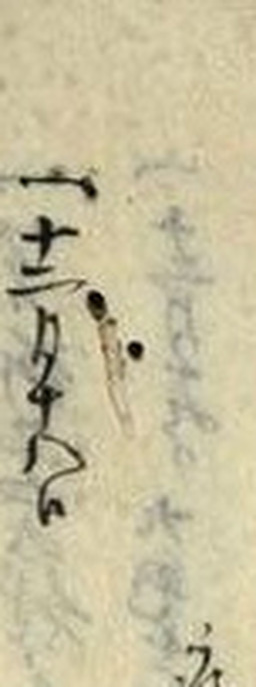一十二月十五日

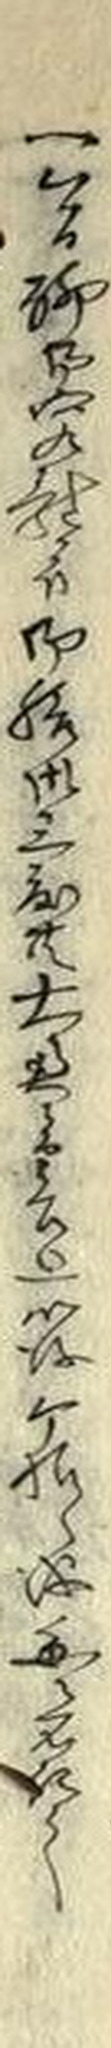一今日聊御容体ニ付御膳御三度共大奥ニ而被召上以後ケ様之儀毎々不記之
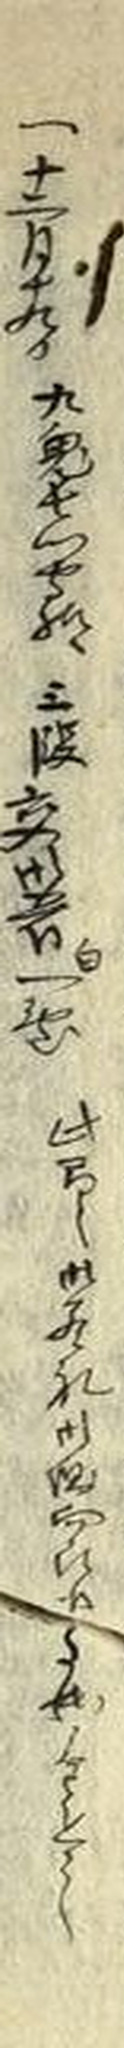一十二月十九日九鬼長門守様へ三段交御肴白一台此間之御答礼御側向頭取手紙ニ而被進之
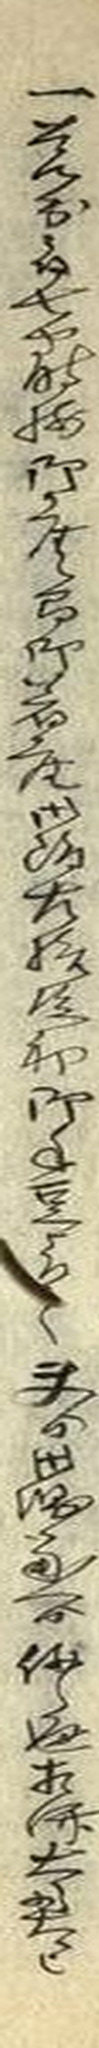一節分ニ付七半時揃御座之間御着座御附左膳殿初御手豆被下之夫ゟ御側御用人ゟ例之通相済大奥へ被
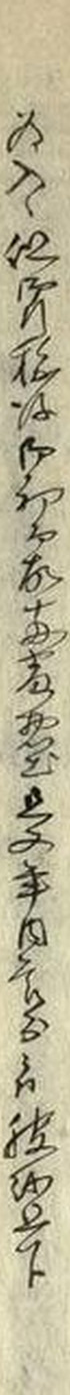為入候但御引移後御初而故両番惣出且又年内節分ニ付服紗上下
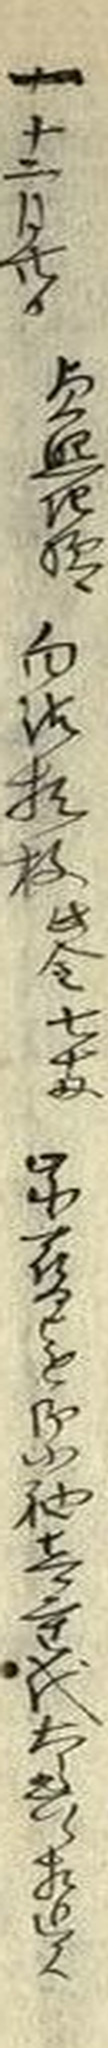一十二月廿日貞照院様へ白銀拾枚此金七両歳暮被進御小袖壱重代大奥へ相廻ス
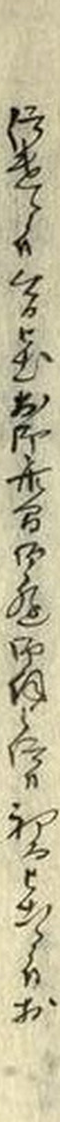仰遣候ニ付今日被出於御居間御逢御伺被仰付初而被出候ニ付於坂上池院老
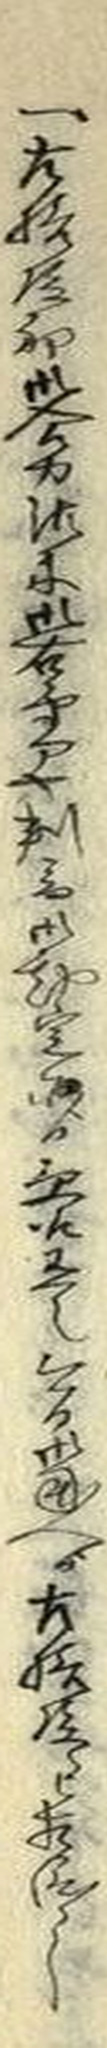一左膳殿初御合力銀米御右筆部屋判ニ而御勘定所ゟ受取有之今日御用人ゟ左膳殿へ被相渡之
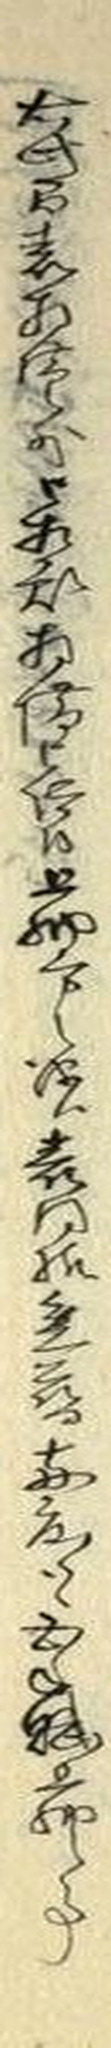右此間表拝借之分被相願拝借被仰付上納方之儀ハ表同様盆暮両度ツヽ五年賦上納之事
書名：少傅日録抄（斉善付側向頭取日記、在府）
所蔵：福井県文書館 Fukui Prefectural Archives
